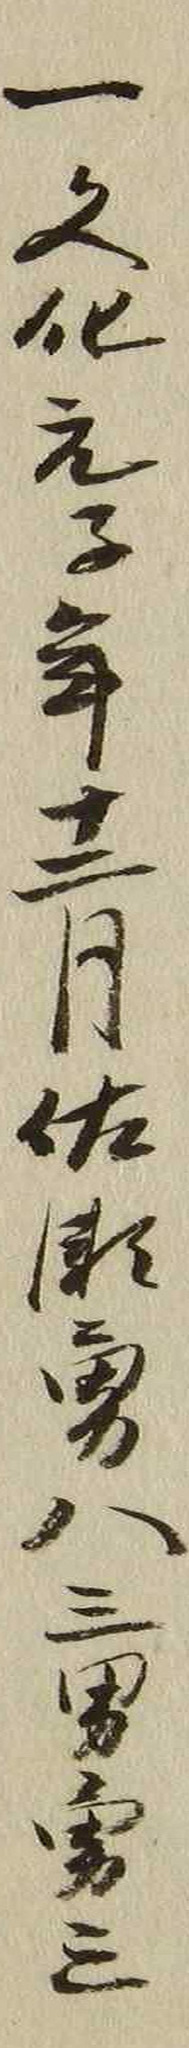一文化元子年十二月佐瀬勇八三男勇三
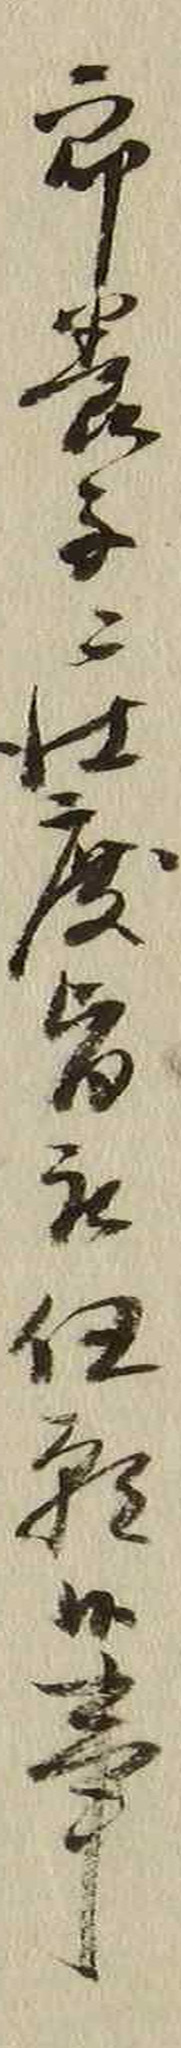郎養子ニ仕度旨被任願候事
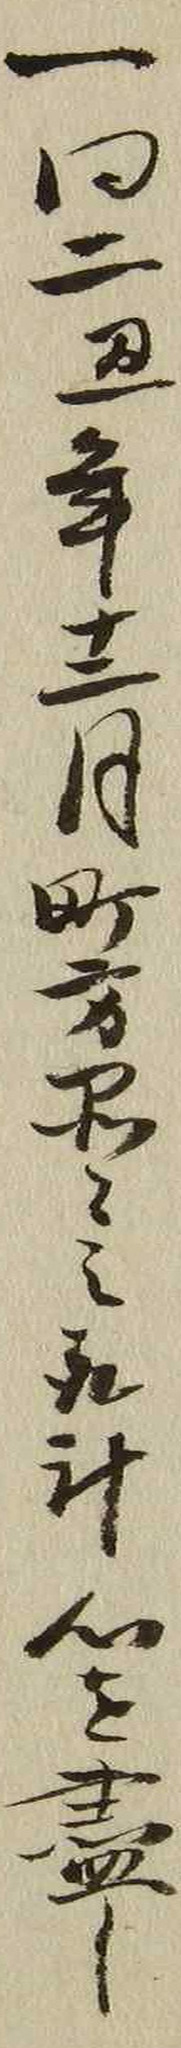一同二丑年十二月町方品々之取計心を尽し
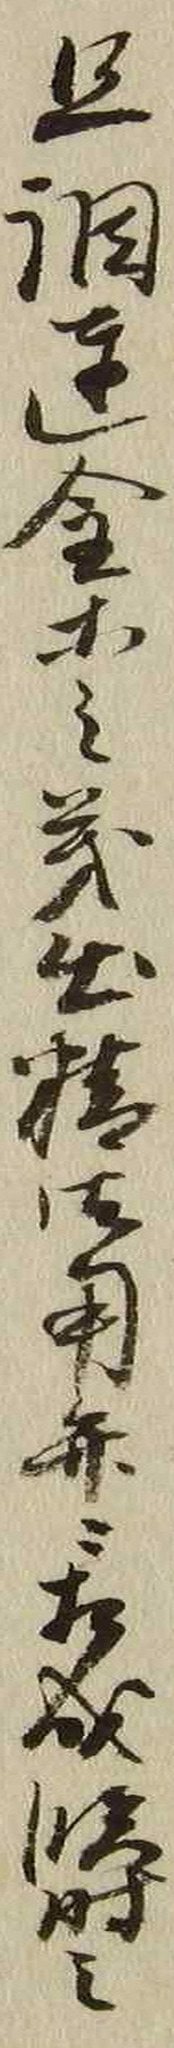且調達金等之義出精御用并ニ相成臨時之
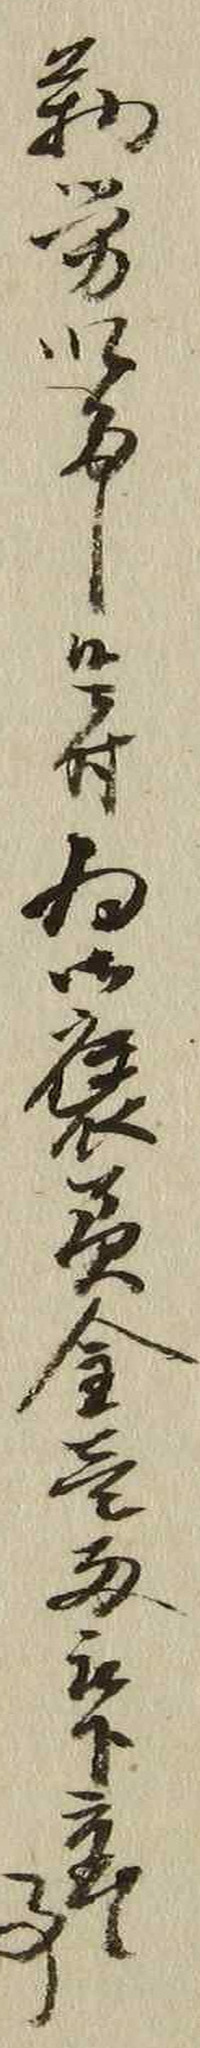勤労いたし候ニ付為御褒美金壱両被下置候事
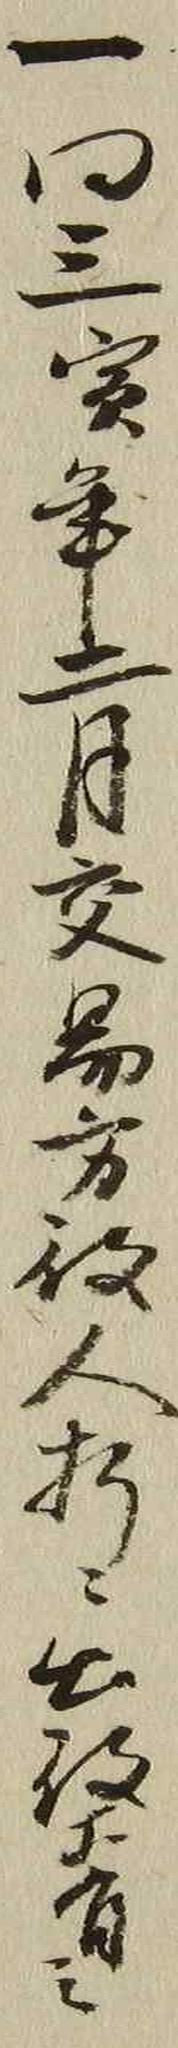一同三寅年二月交易方役人折々出役等有之
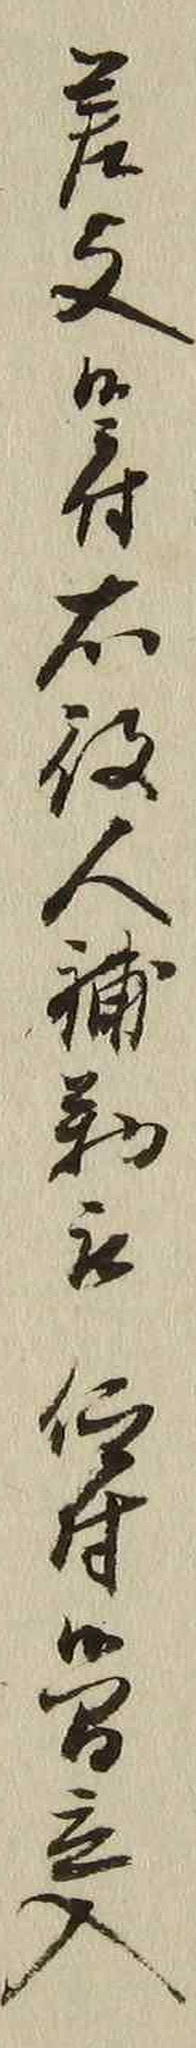差支候ニ付右役人補勤被仰付候間立入
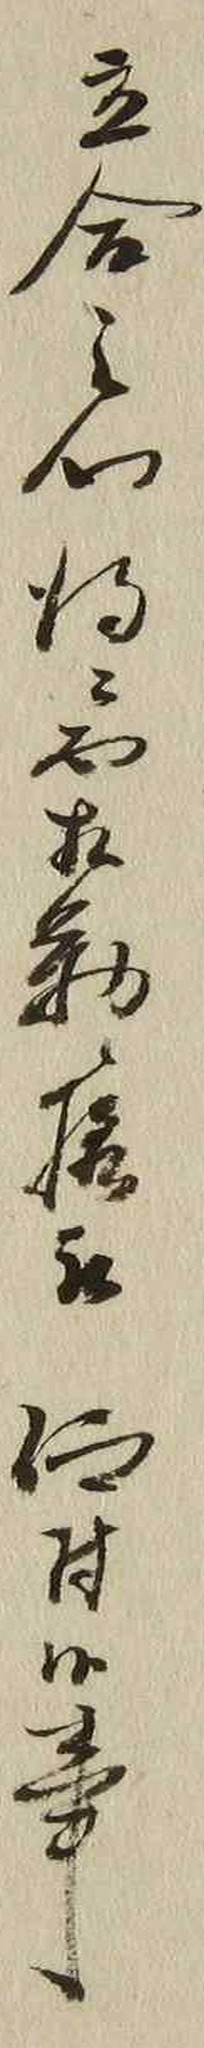立合之心得ニ而相勤候様被仰付候事
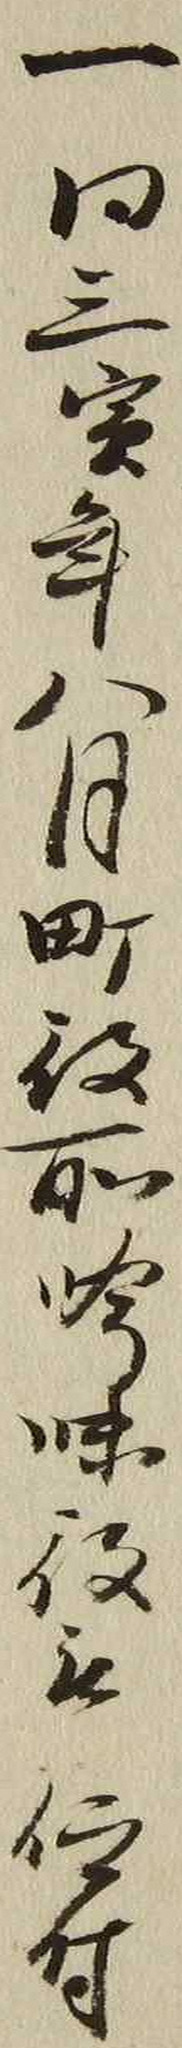一同三寅年八月町役所吟味役被仰付
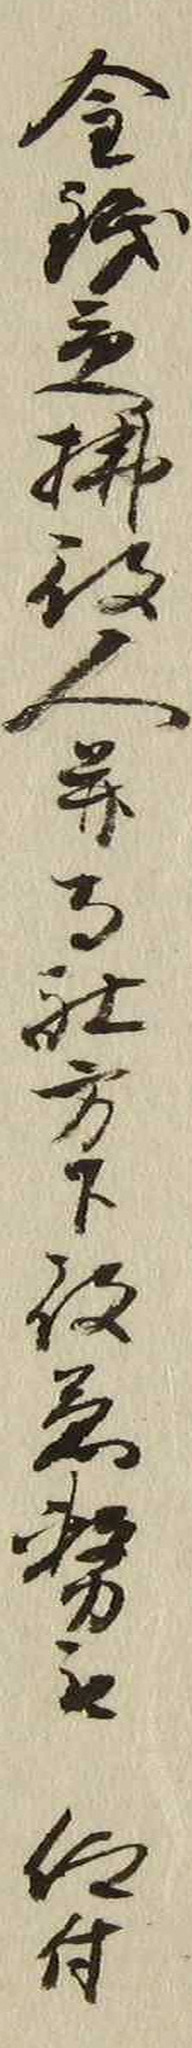金銭受払役人并寺社方下役兼務被仰付
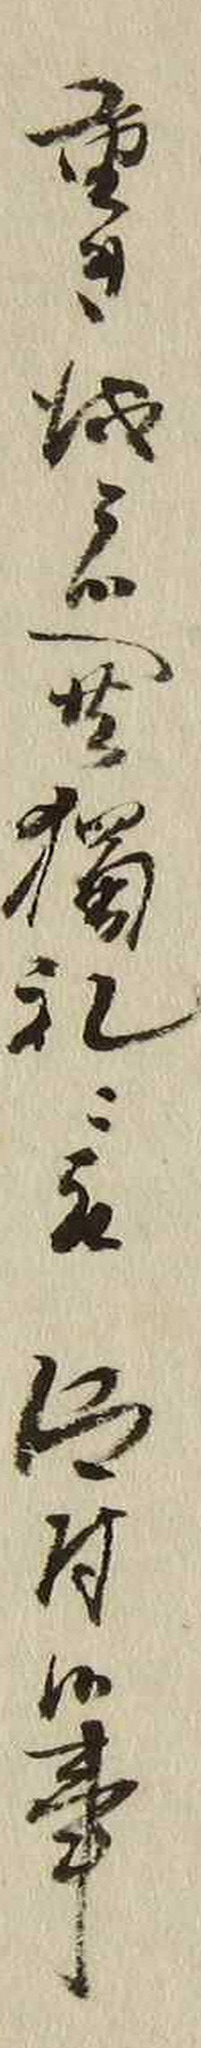重き儀ニ候へ共独礼ニ被仰付候事
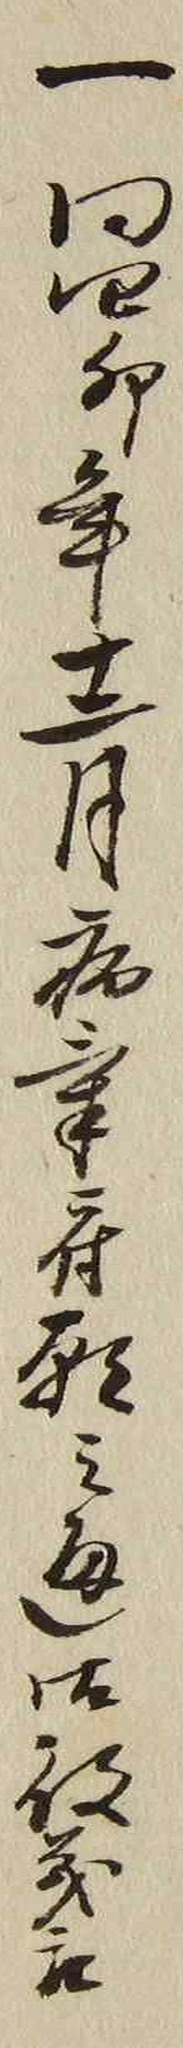一同四卯年十二月病気ニ付願之通御役義被
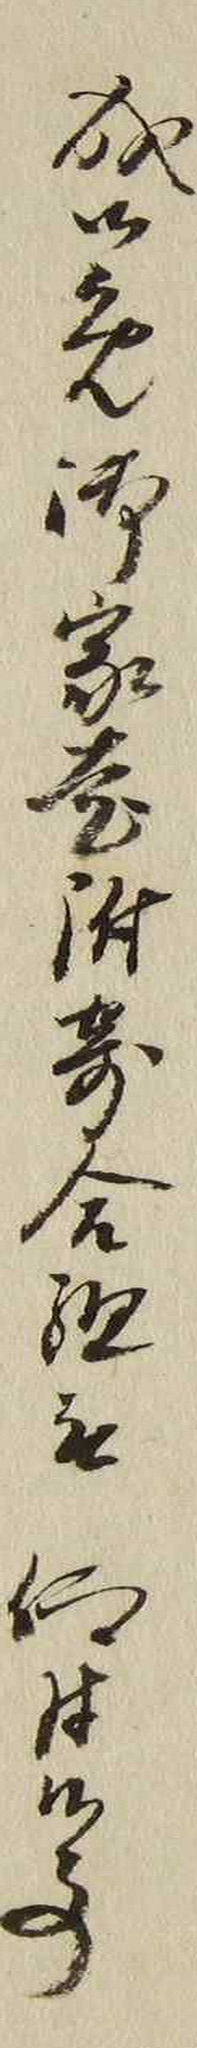成御免御家老附寄合組被仰付候事
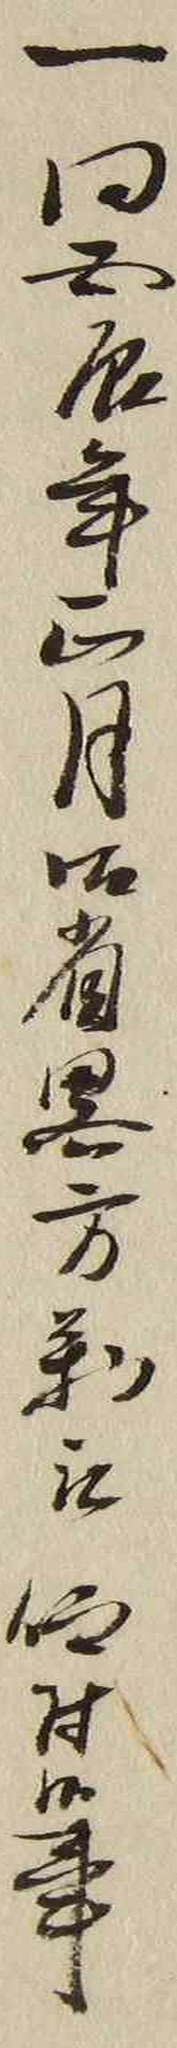一同五辰年正月御省略方勤被仰付候事
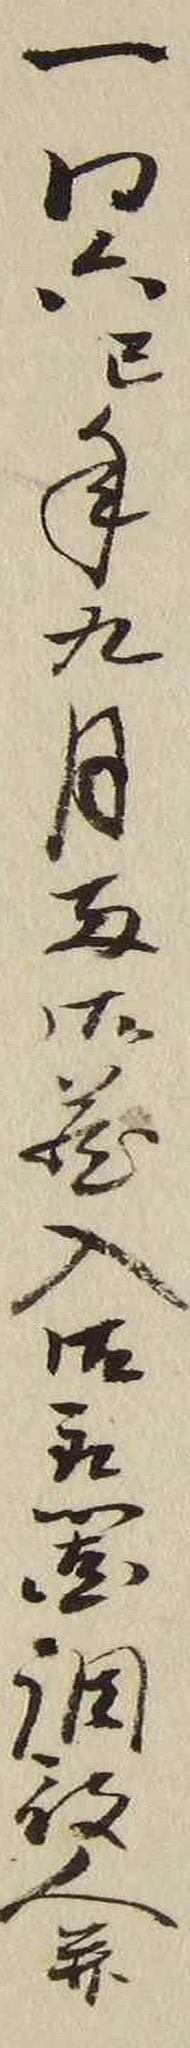一同六巳年九月両御蔵入御取箇調役人并
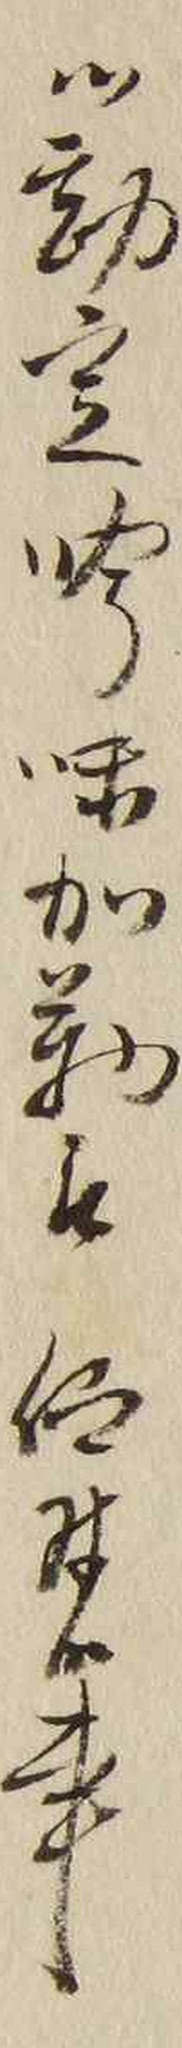御勘定吟味加勤被仰付候事
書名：諸士系譜　巻之360　す之部10
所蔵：会津若松市立会津図書館
